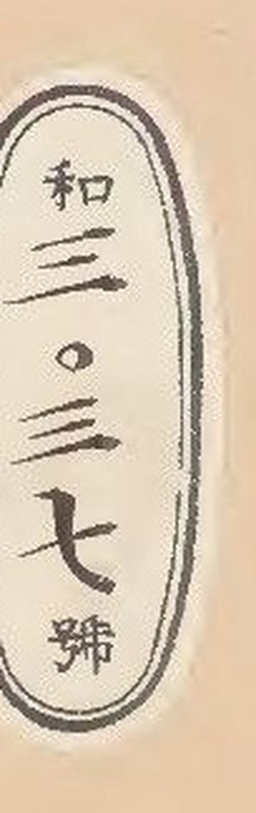和三〇三七号
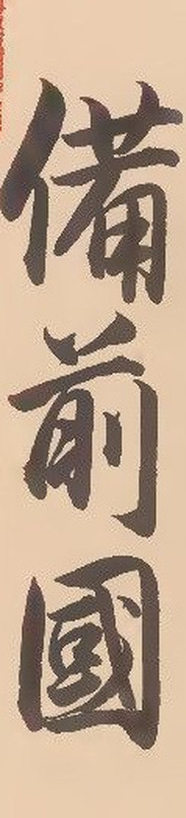備前国
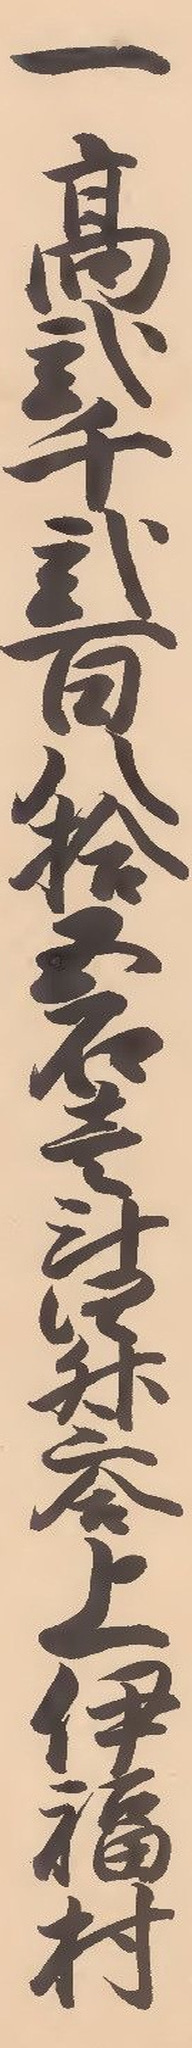一高弐千弐百八拾五石壱斗四升二合上伊福村
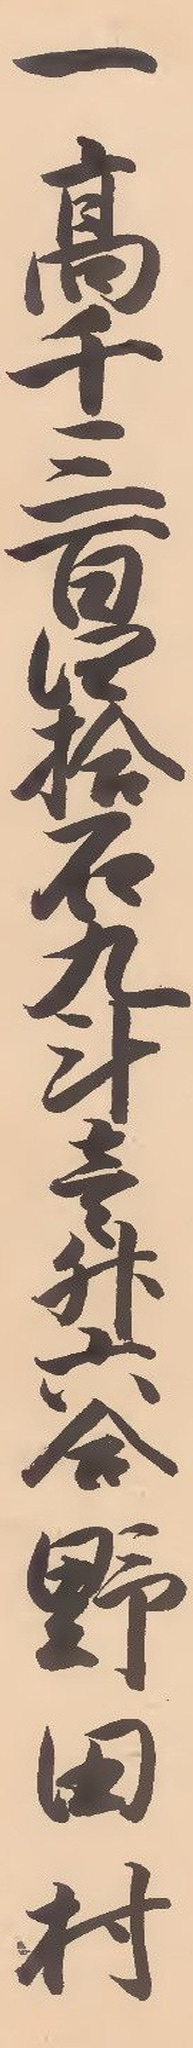一高千三百四拾石九斗壱升六合野田村

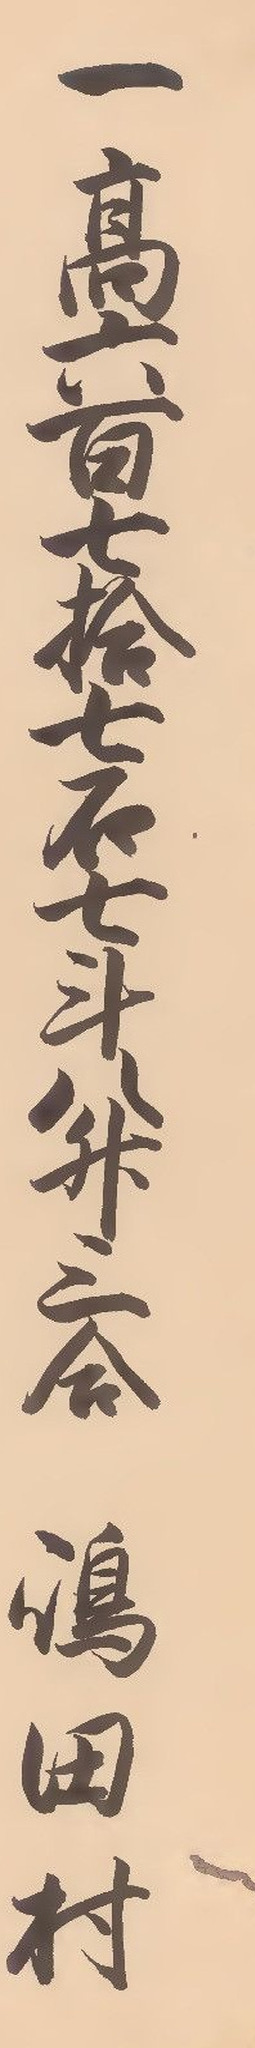一高六百七拾七石七斗八升三合島田村
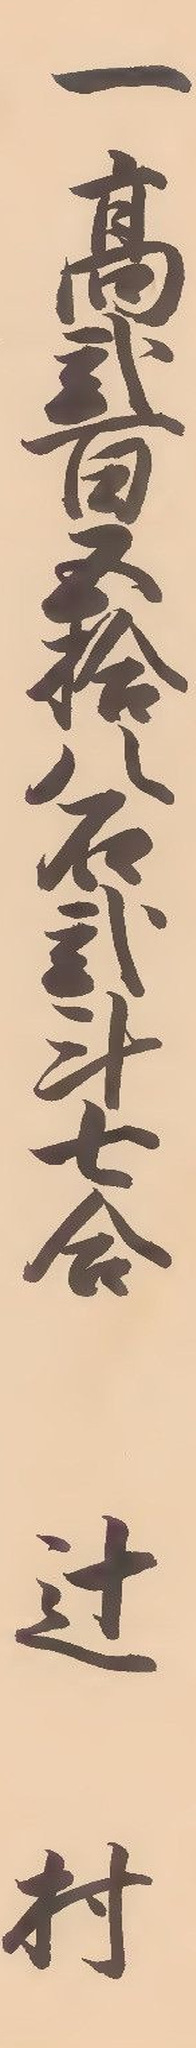一高弐百五拾八石弐斗七合辻村
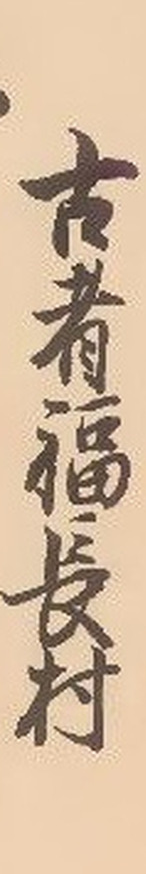古者福長村
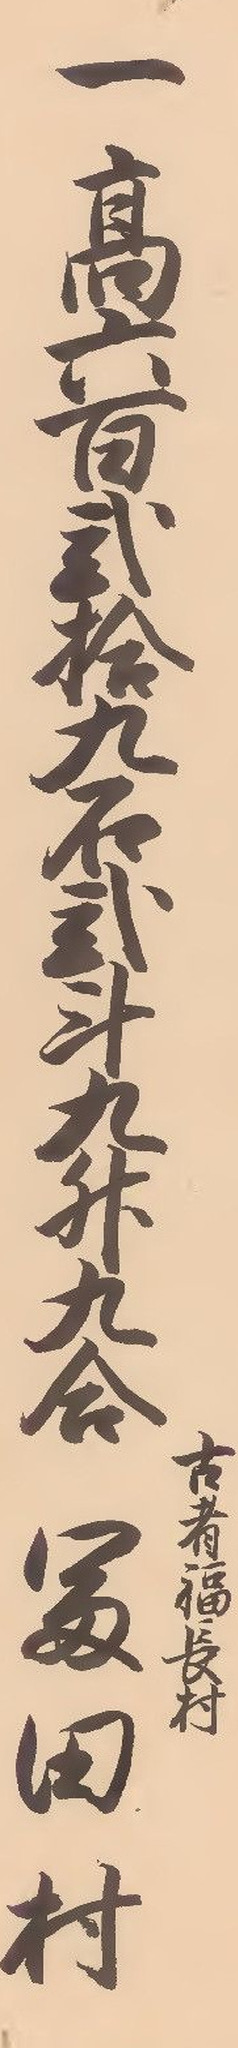一高六百弐拾九石弐斗九升九合富田村
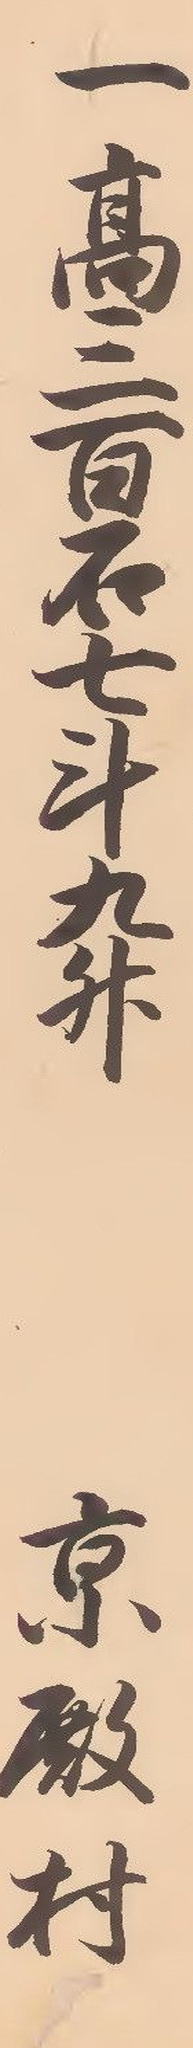一高三百石七斗九升京殿村
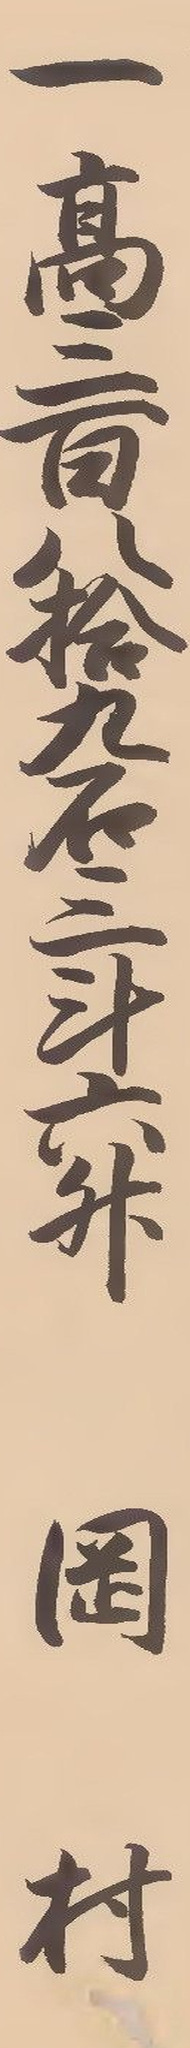一高三百八拾九石三斗六升岡村
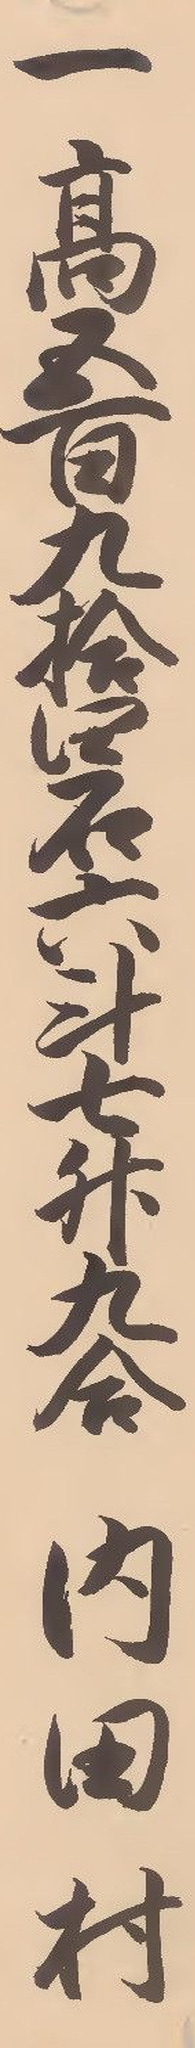一高五百九拾四石六斗七升九合内田村
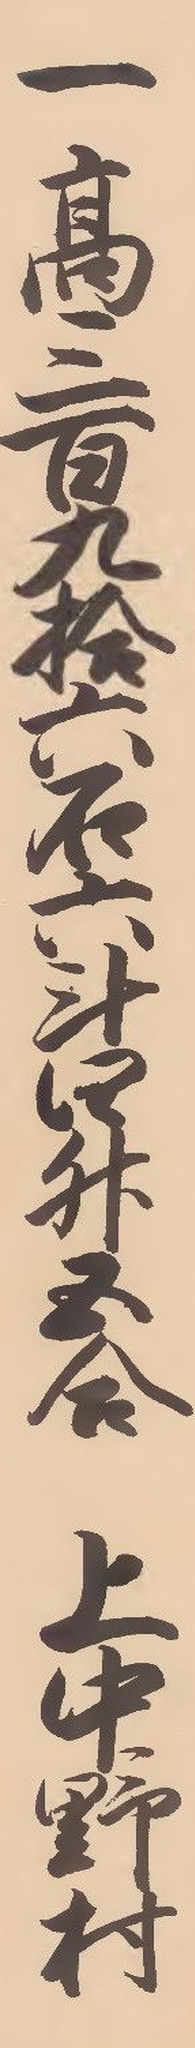一高三百九拾六石六斗四升五合上中野村
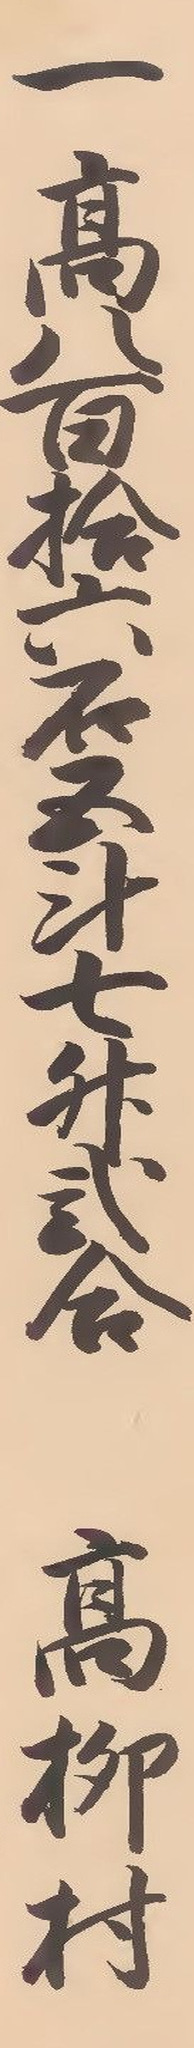一高八百拾六石五斗七升弐合高柳村

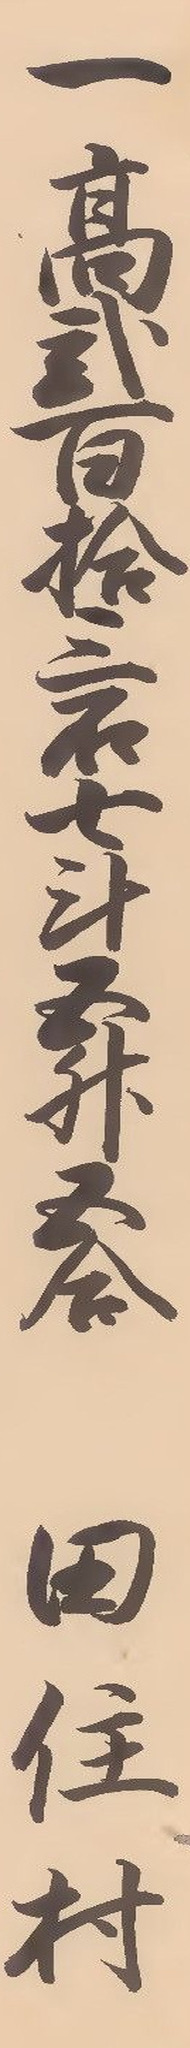一髙弐百拾三石七斗五升五合田住村
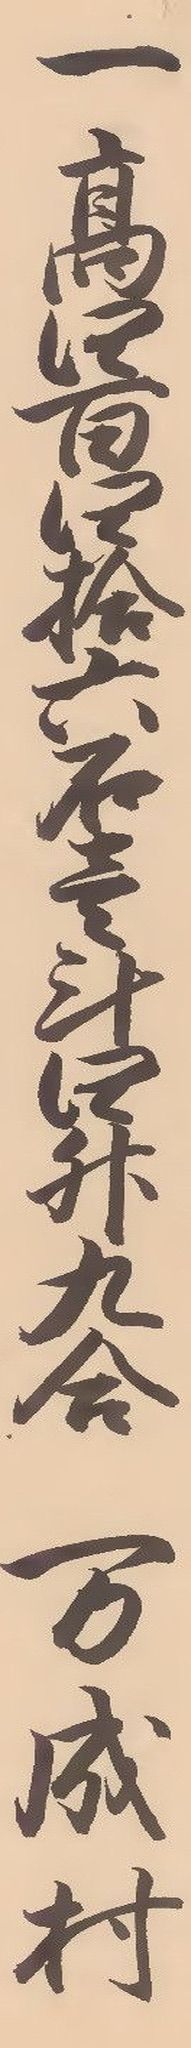一髙四百四拾六石壱斗四升九合万成村
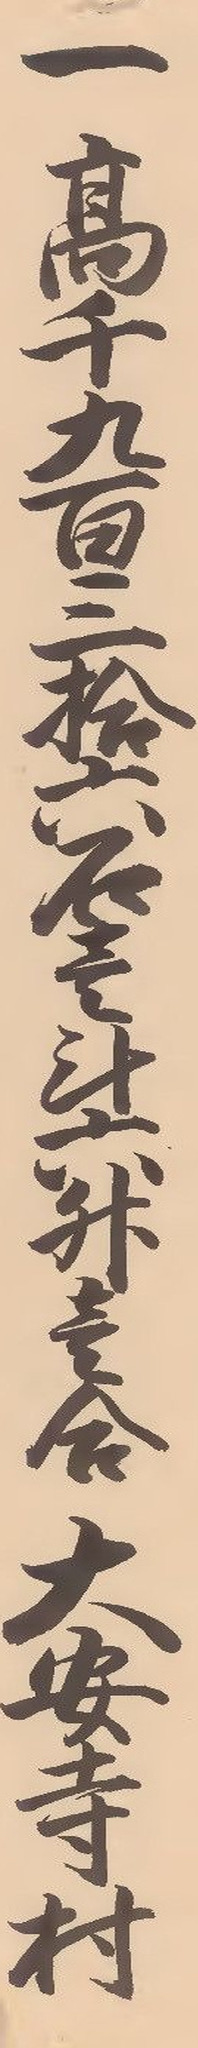一髙九百三拾六石壱斗六升壱合大安寺村
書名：備前国郷帳
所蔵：国立公文書館 National Archives of Japan
